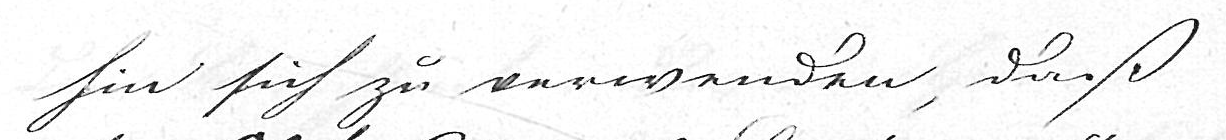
hin sich zu verwenden, daß
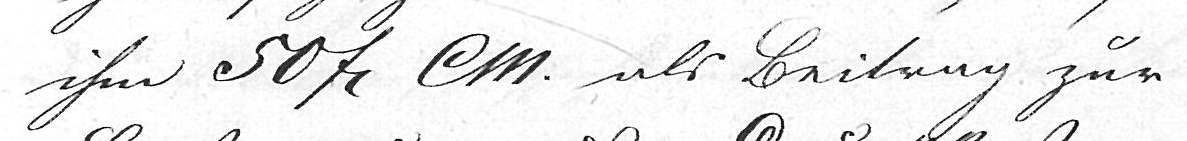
ihm 50 fr. CM. als Beitrag zur
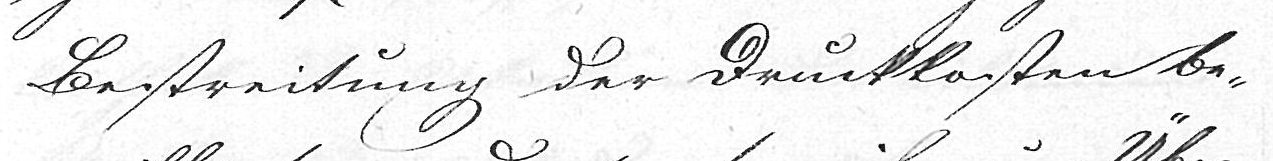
Bestreitung der Druckkosten be-
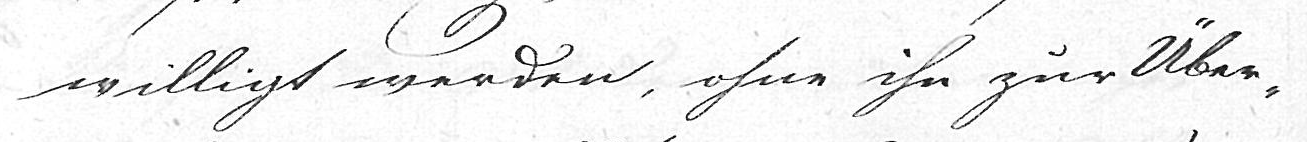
willigt werden, ohne ihn zur Über-
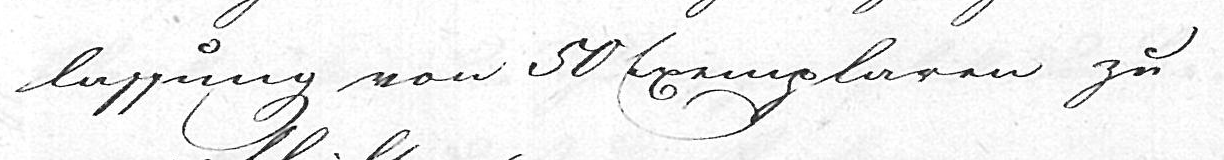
lassung von 50 Exemplaren zu
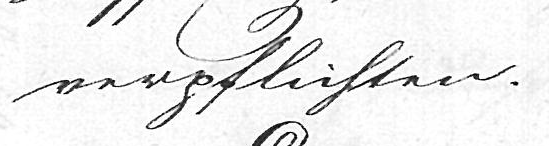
verpflichten.
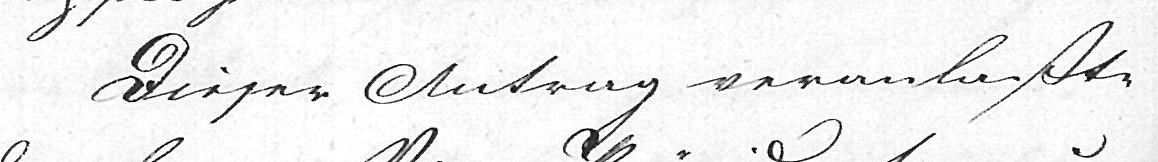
Dieser Antrag veranlaßte
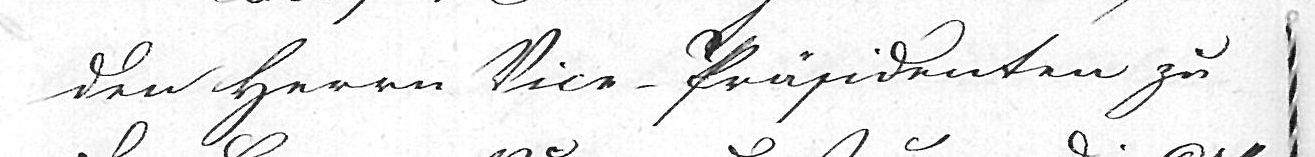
den Herrn Vice-Präsidenten zu
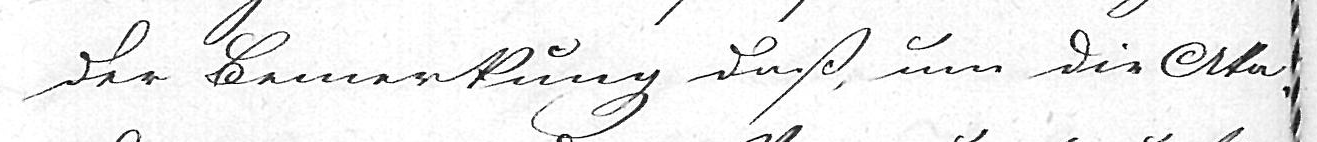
der Bemerkung daß um die Aka-
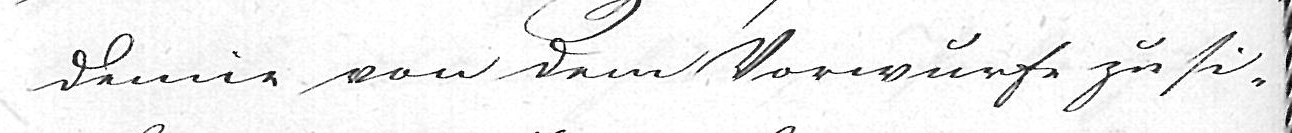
demie von dem Vorwurfe zu si-
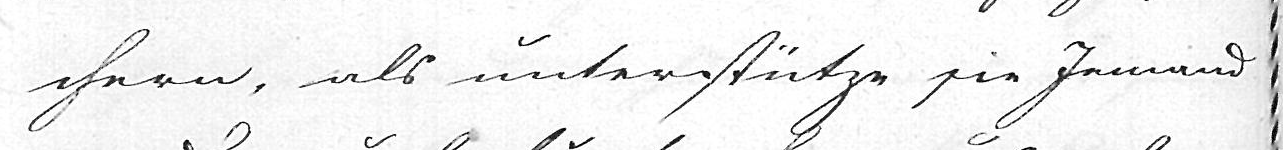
chern, als unterstütze sie Jemand
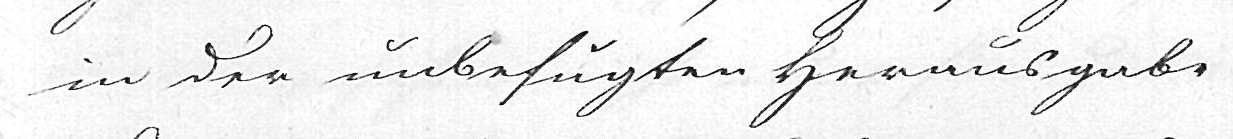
in der unbefugten Herausgabe
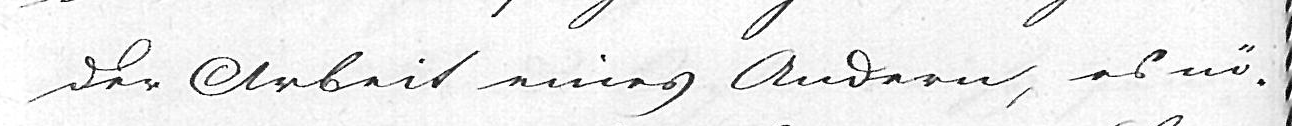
der Arbeit eines Andern, es nö-
